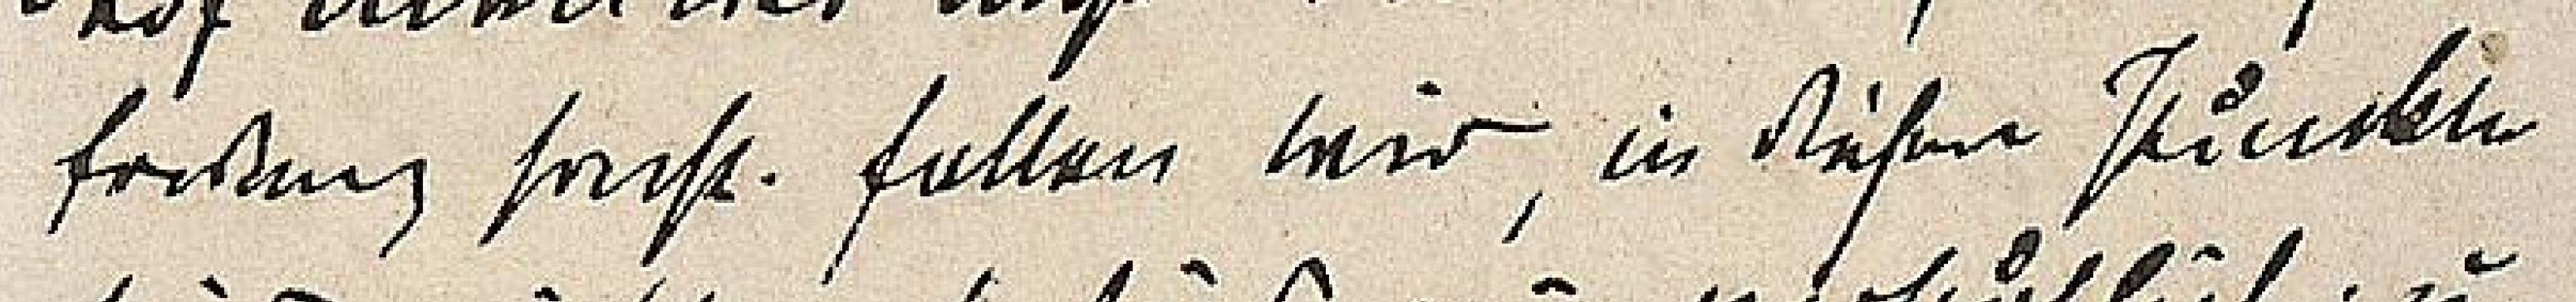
fordern, sonst fallen wir, in diesem Punkte
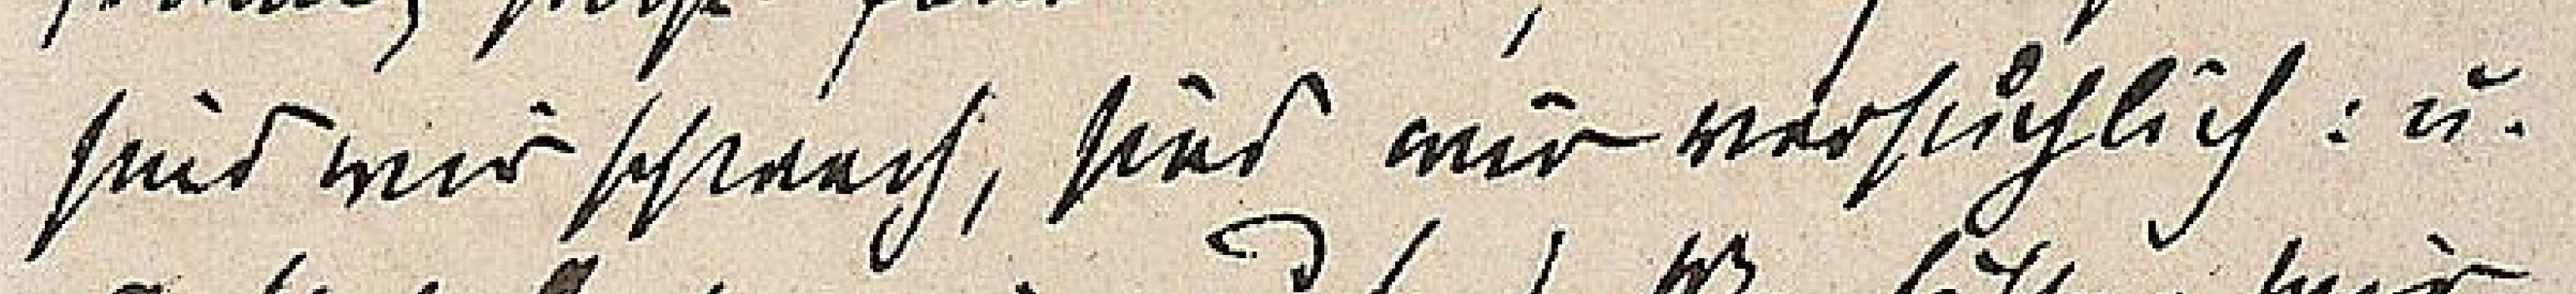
sind wir schwach, sind wir versuchlich: u.
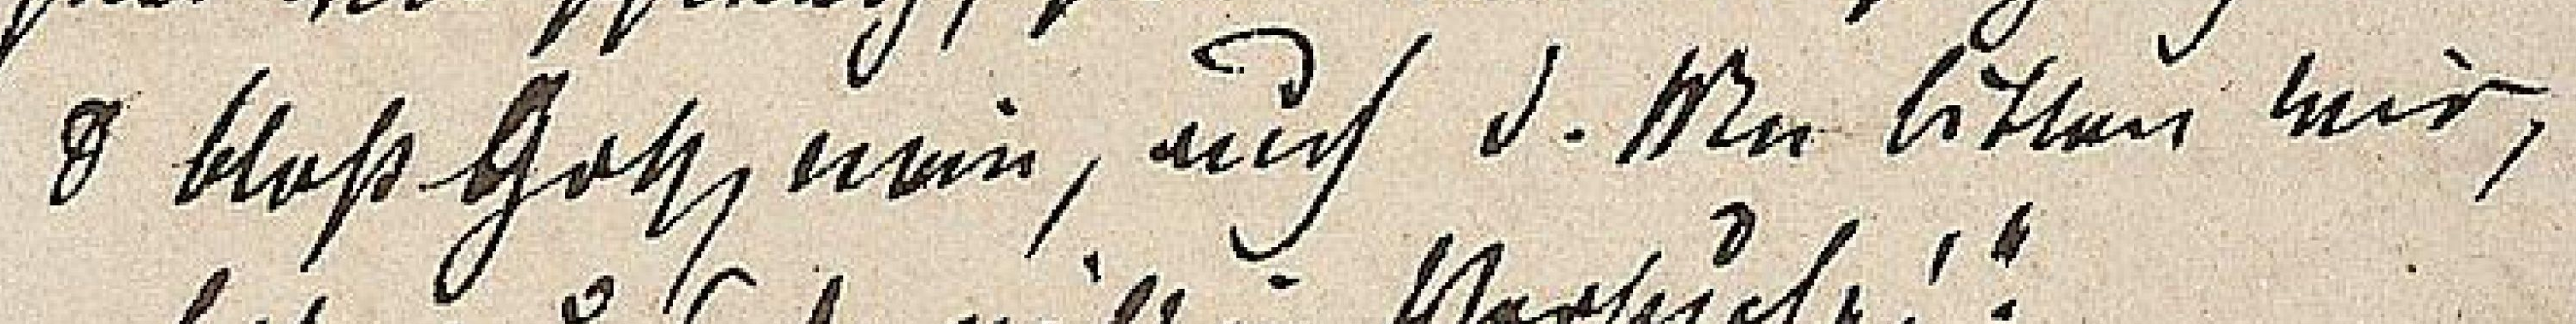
o bloß Gott, nein, auch d. Mn bitten wir,
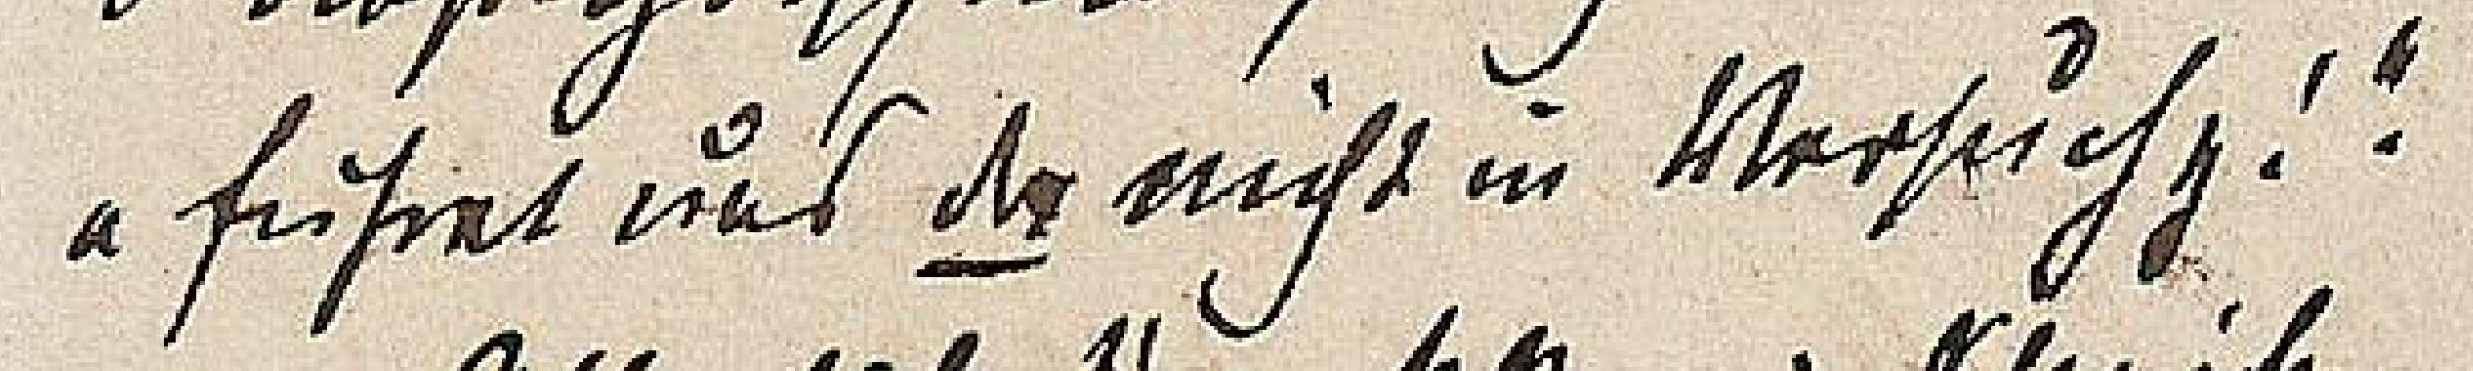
"führet uns da nicht in Versuchg!!"
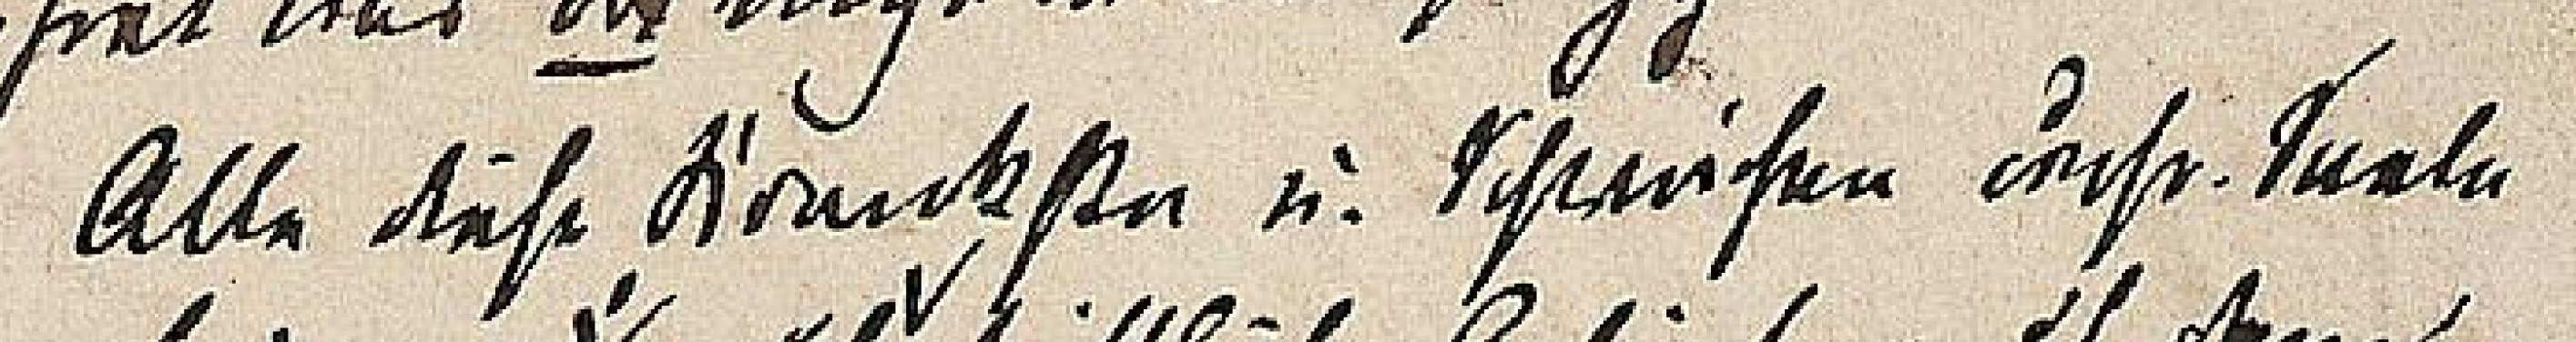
Allen diese Krankhtn u. Schwächen unsr Seele
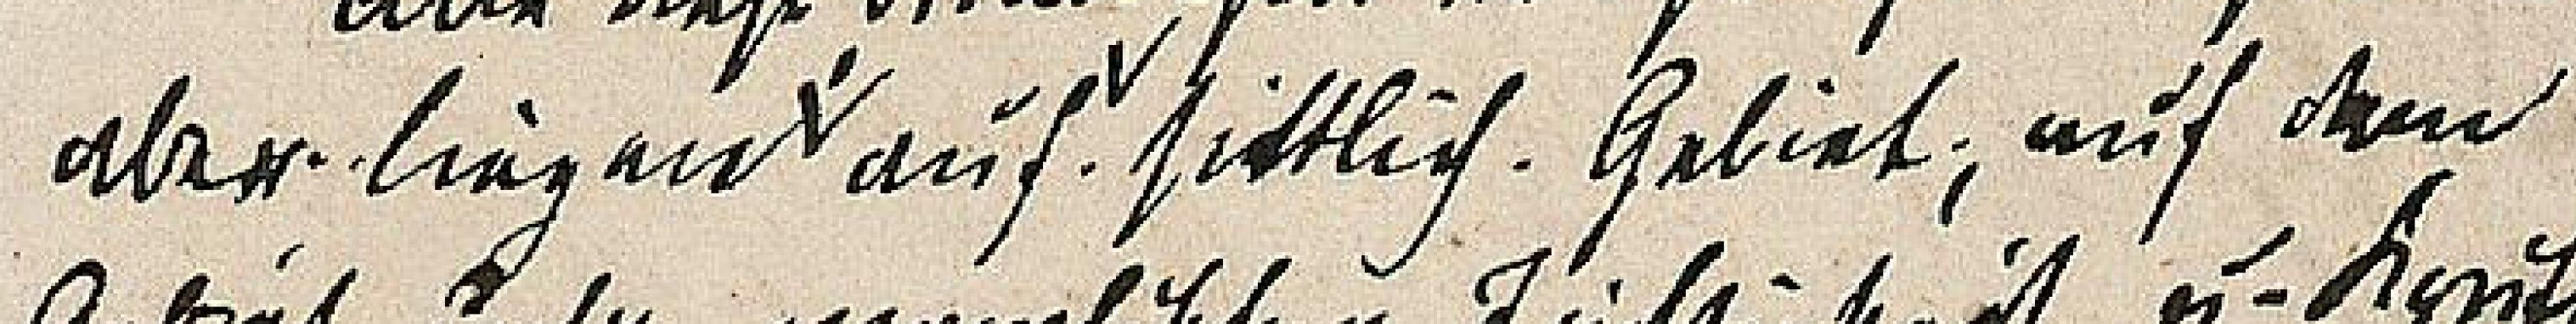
aber liegen V auf V sittlich. Gebiet, auf dem
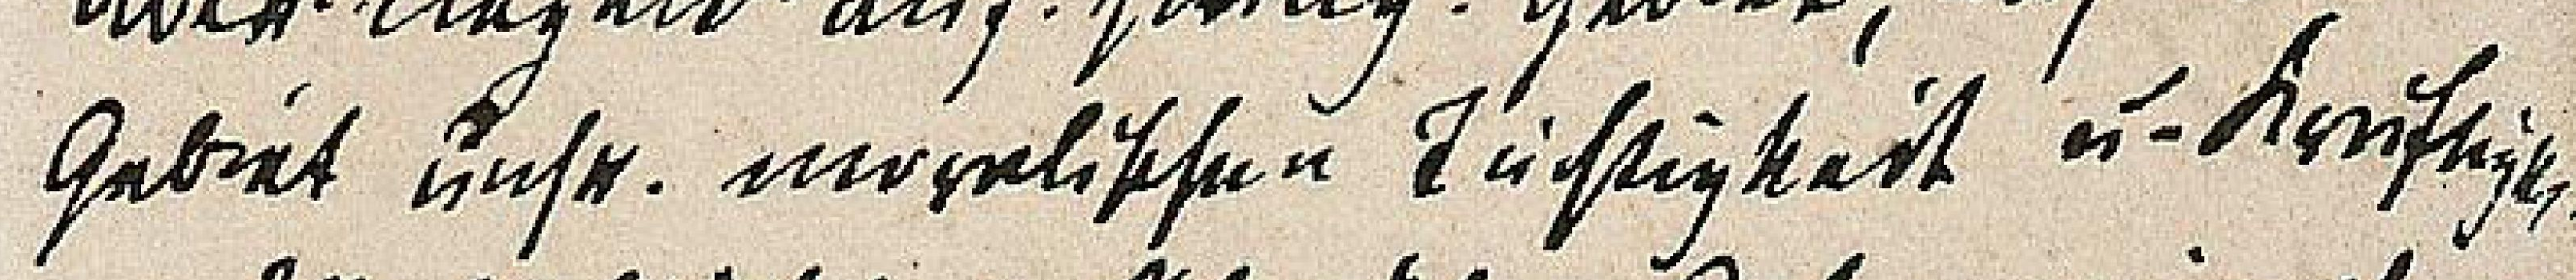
Gebiet unsr. moralischen Tüchtigkeit u. Kräftign,
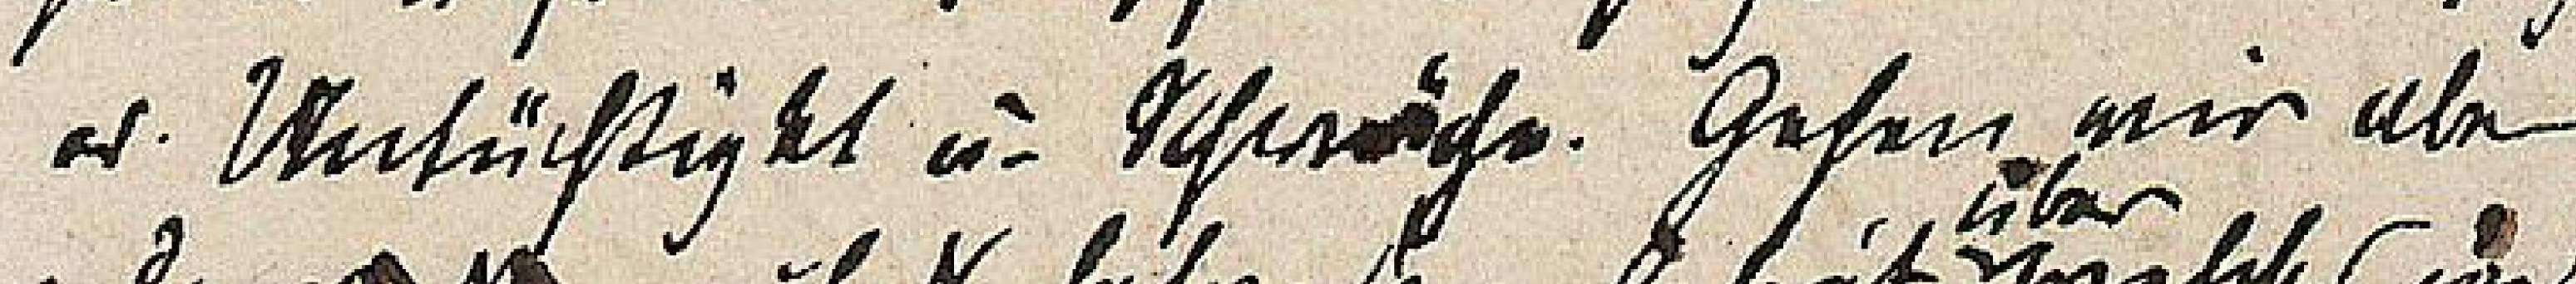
od. Untüchtigkt. u. Schwäche. Gehen wir aber
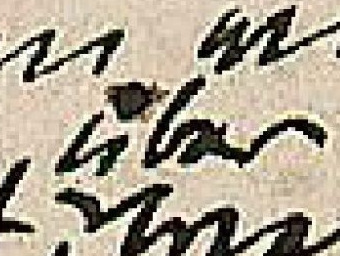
über
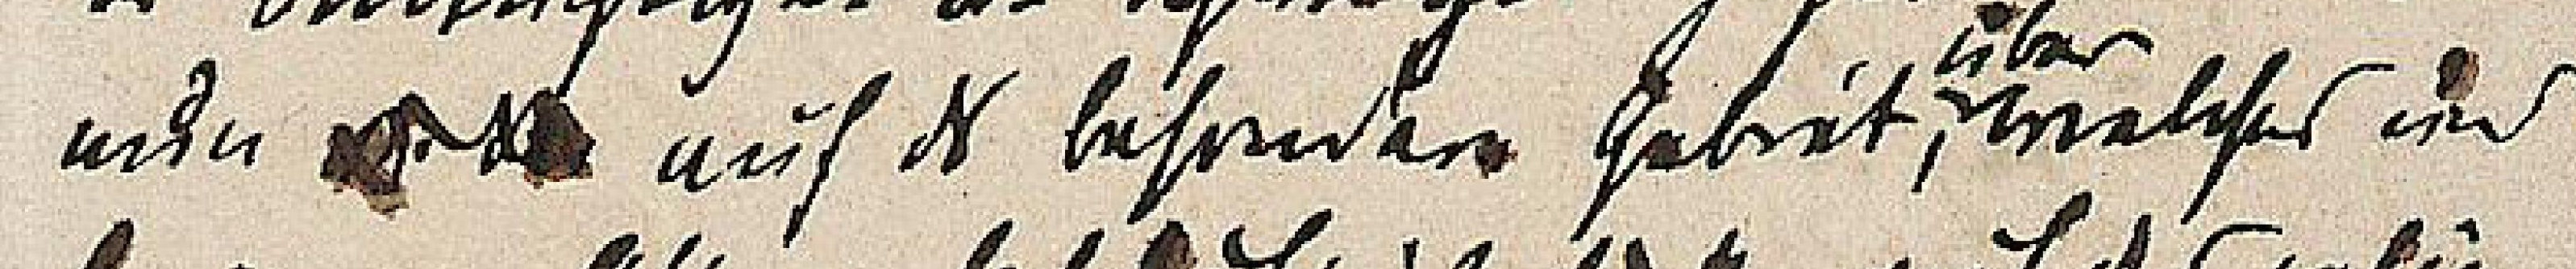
nun v. d. auf das besondere Gebiet, welches uns
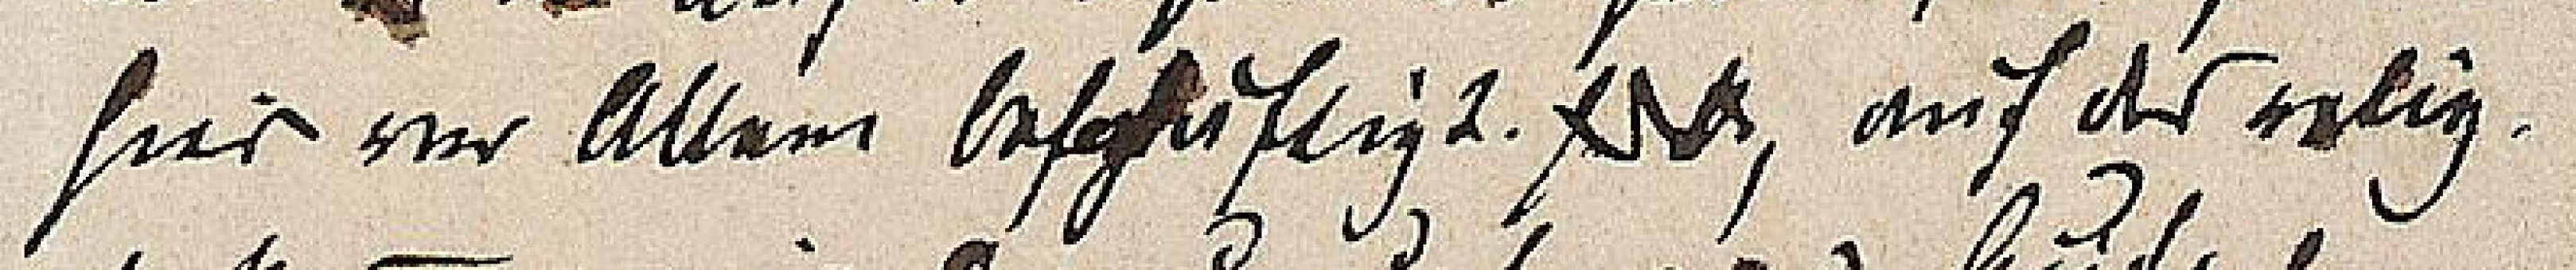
hier vor Allem befähigt. sn da, auf das relig.
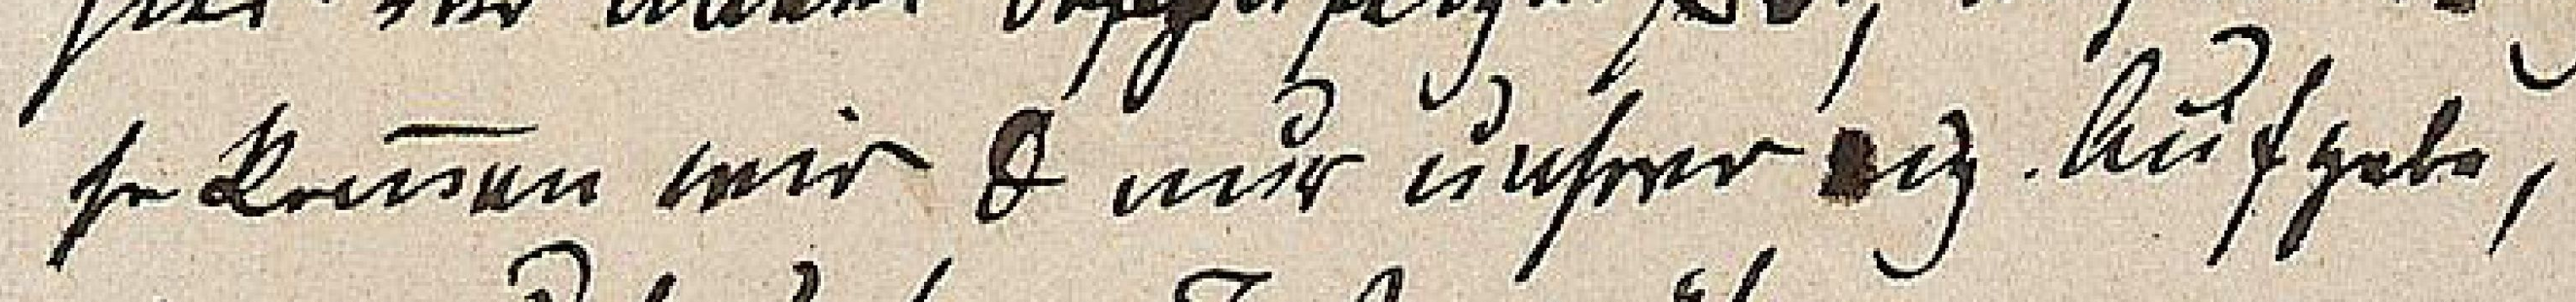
so komen wir o nur unsrer eig. Aufgabe,
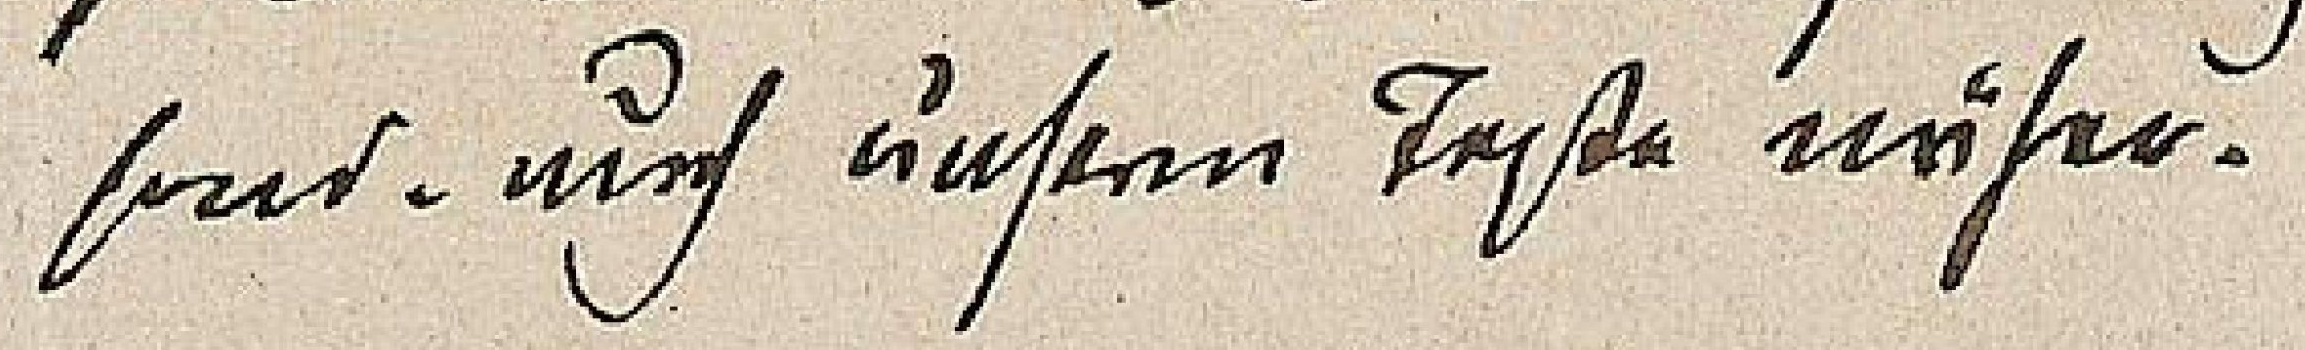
sond. auch unserm Texte näher.
